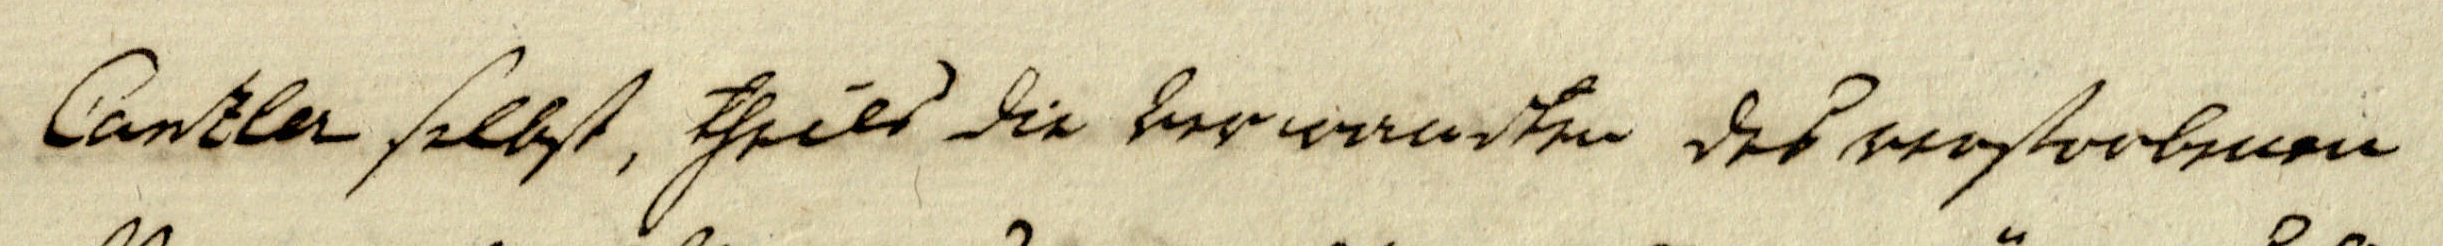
Canzler selbst, theils die Verwandten des verstorbenen
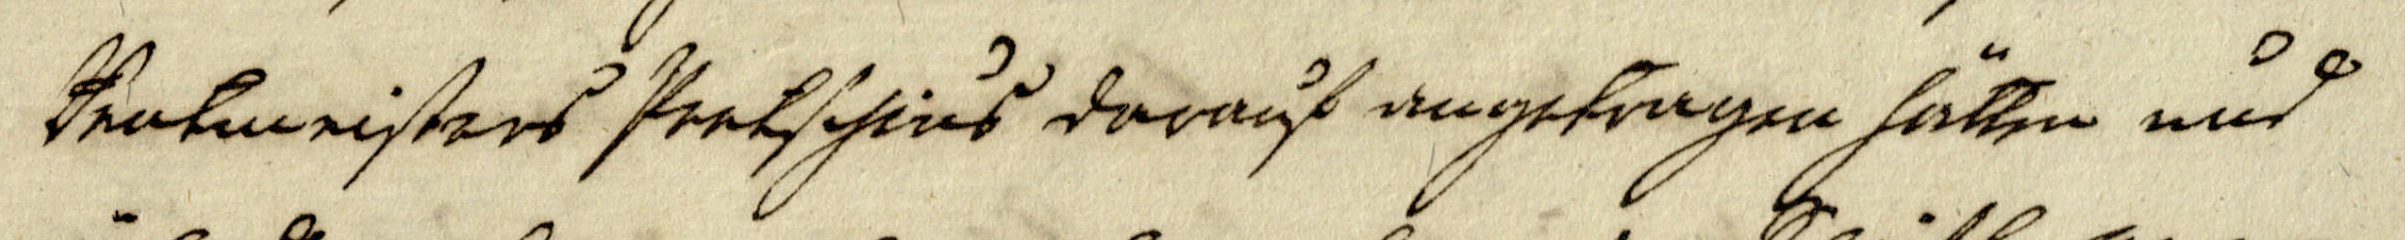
Rentmeisters Peetschius darauf angetragen hätten und
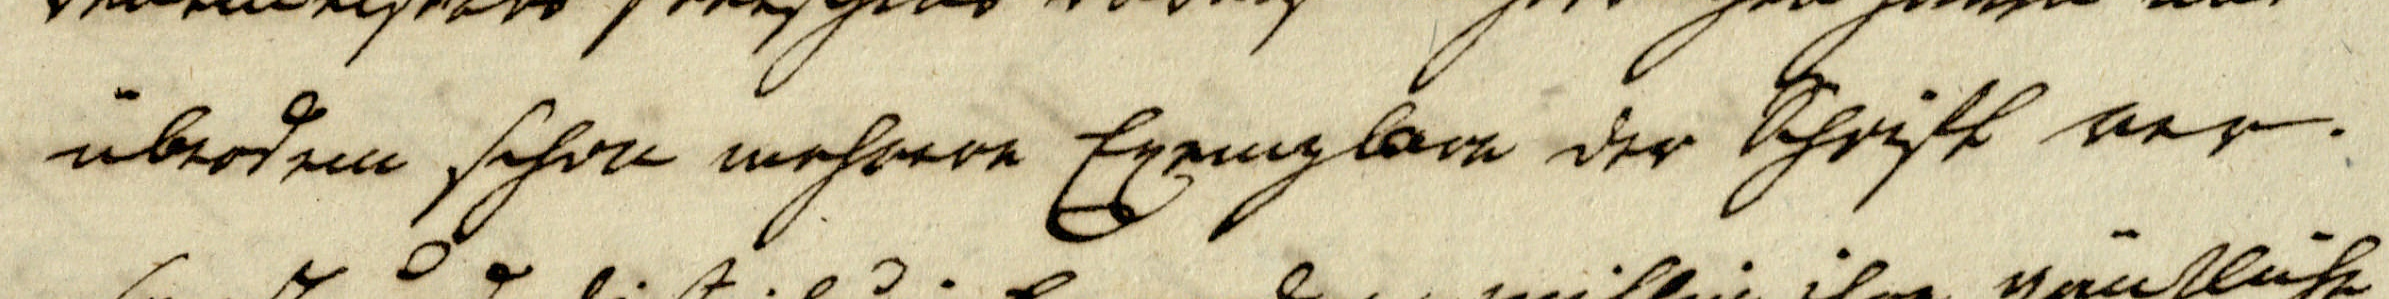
überdem schon mehrere Exemplare der Schrift ver¬
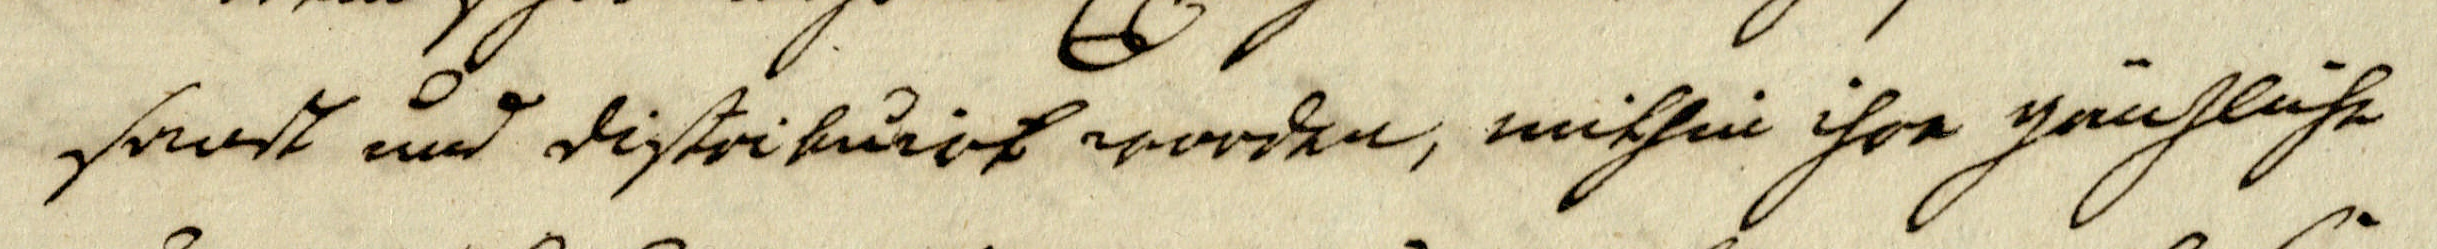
sandt und distribuirt worden, mithin ihre gänzliche
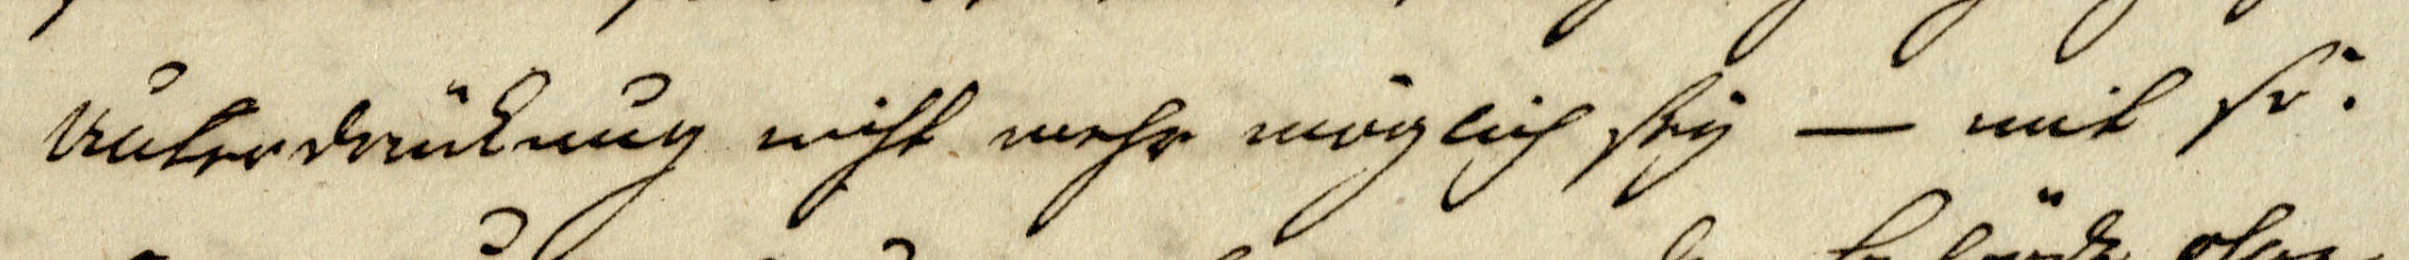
Unterdrückung nicht mehr möglich seÿ mit so¬
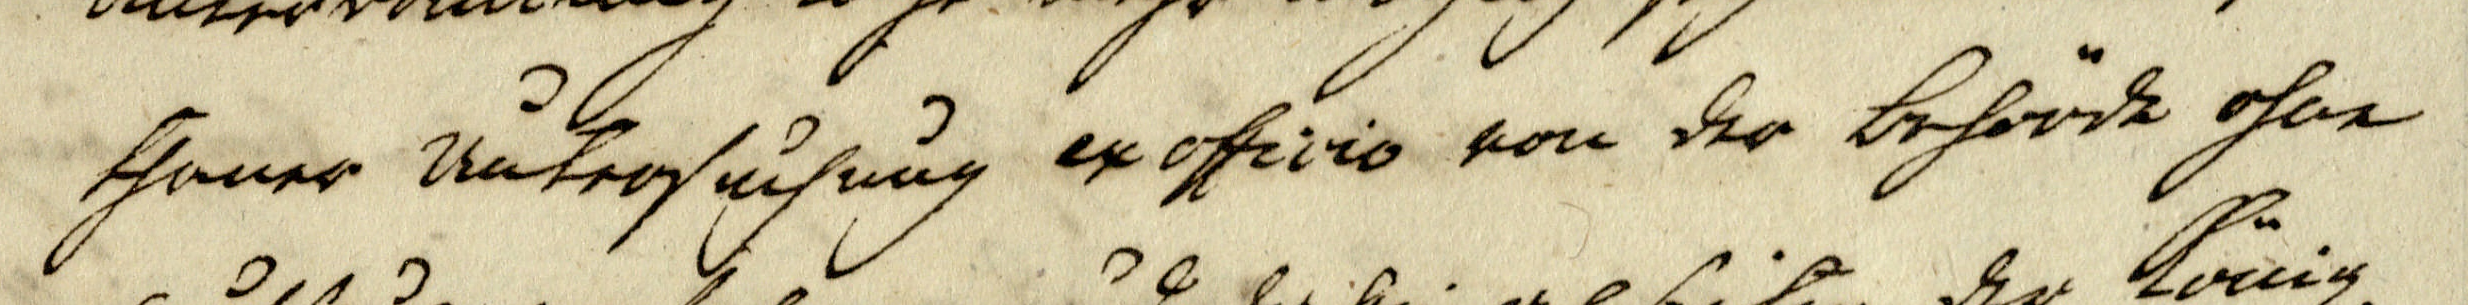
thaner Untersuchung ex officio von der Behörde ohne
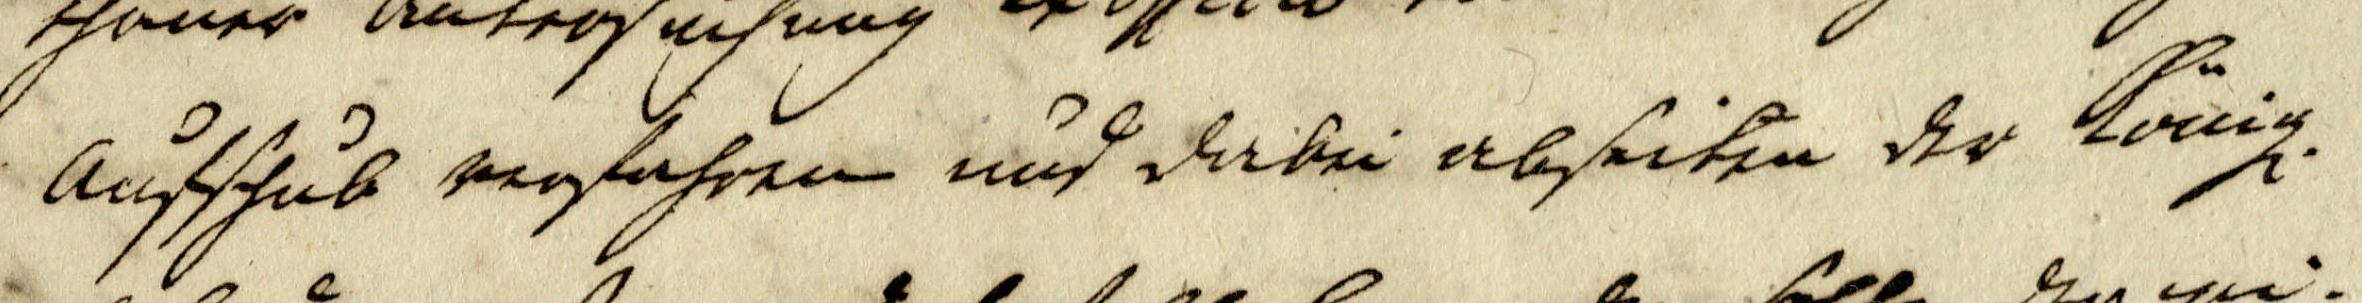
Aufschub verfahren und dabei abseiten der Königl.
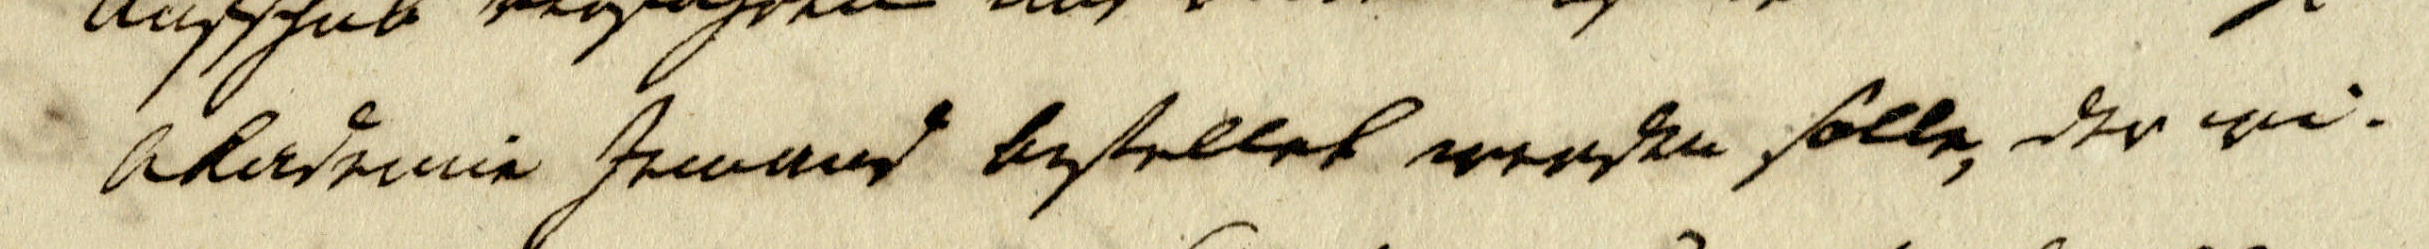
Akademie Jemand bestellet werden solle, der wi¬
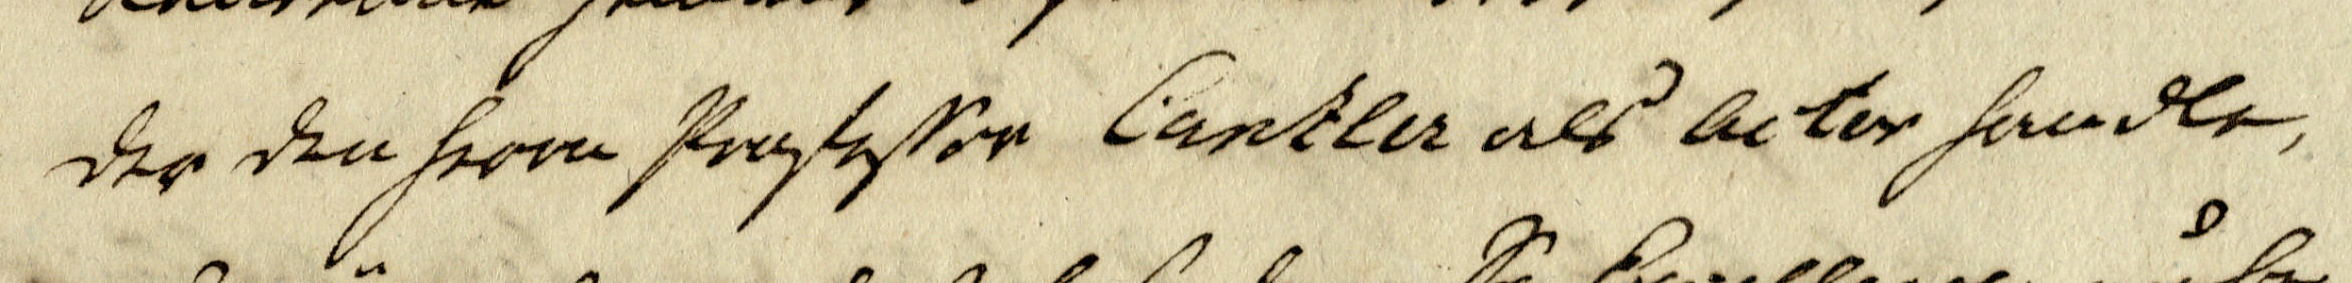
der den Herrn Professor Canzler als Actor handle,
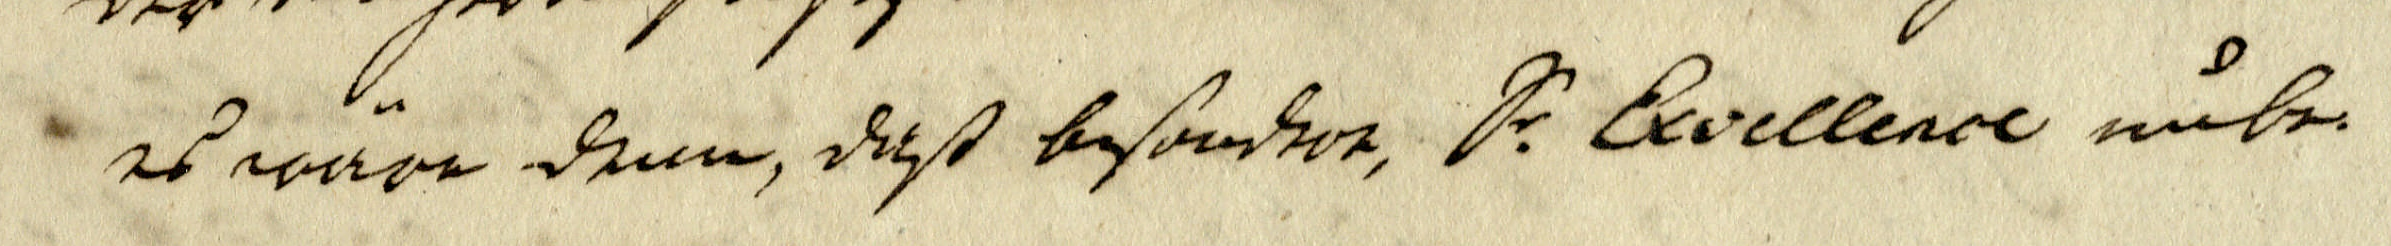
es wäre denn, daß besondere, Sr Excellence unbe¬
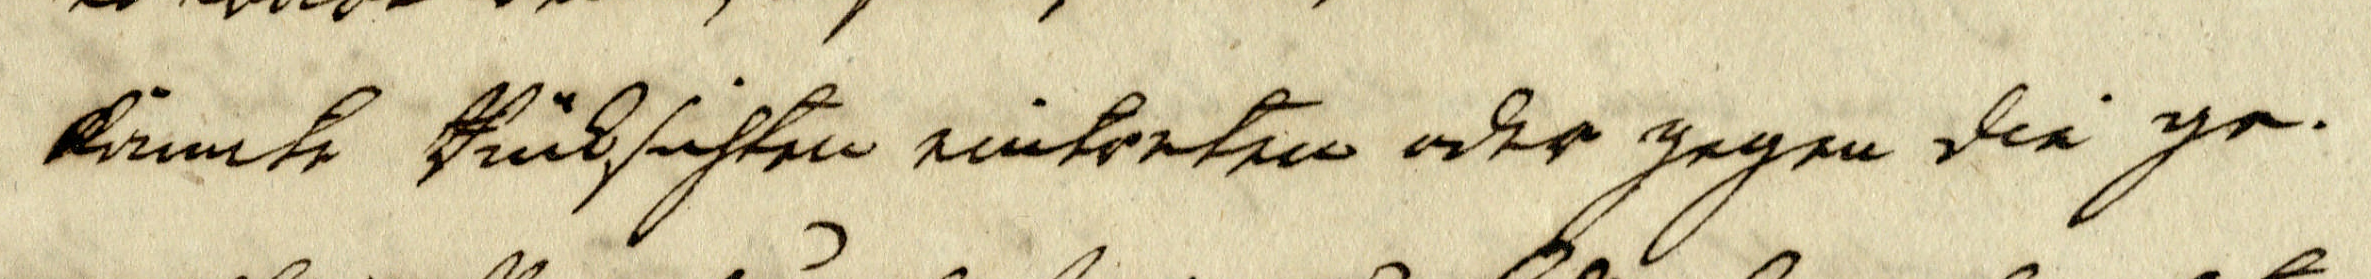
kannte Rücksichten eintreten oder gegen die ge¬
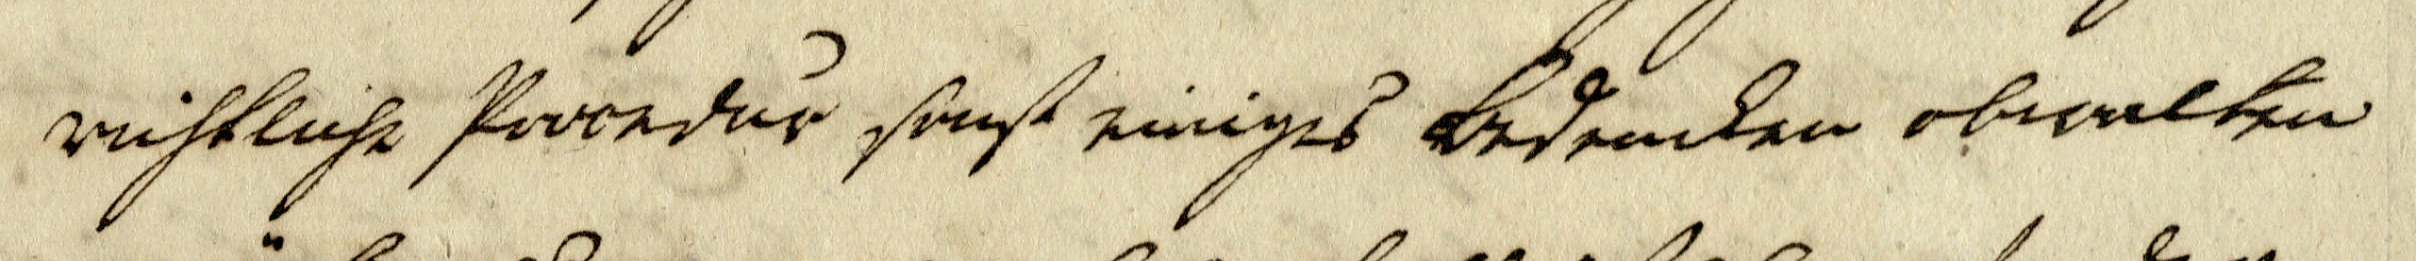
richtliche Procedur sonst einiges Bedencken obwalten
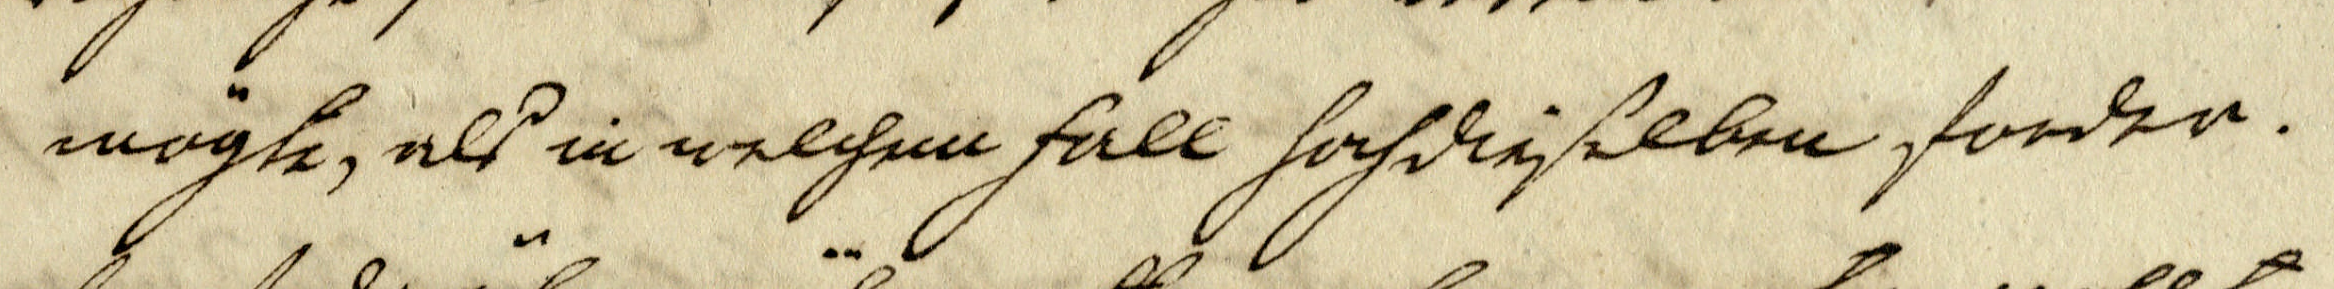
mögte, als in welchem Fall hochdieselben forder¬
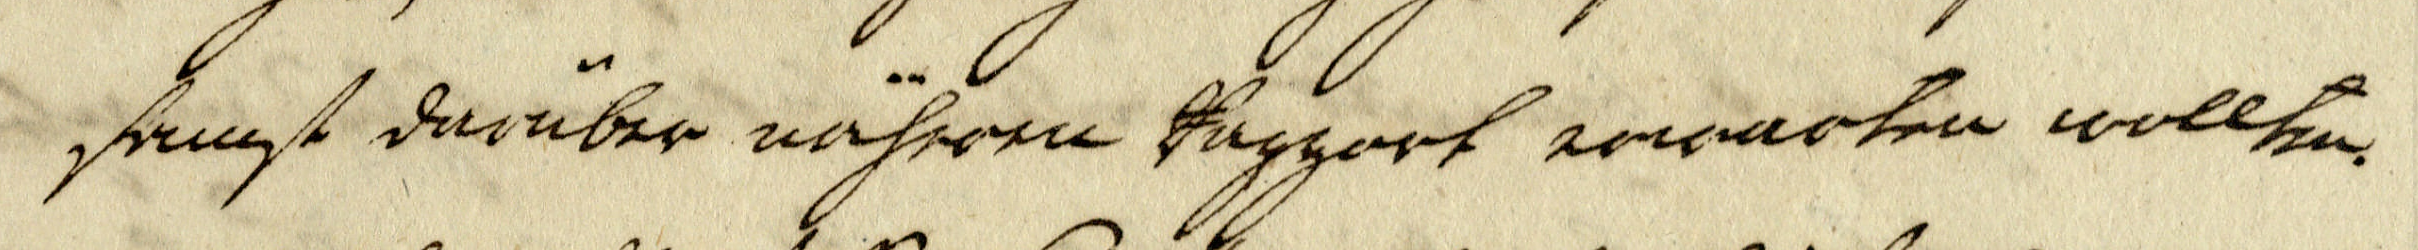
samst darüber näheren Rapport erwarten wollten.
